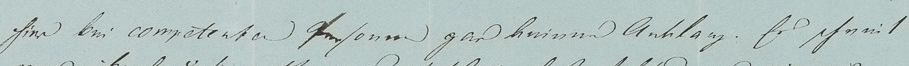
hier bei competenten Personen gar keinen Anklang. Es scheint
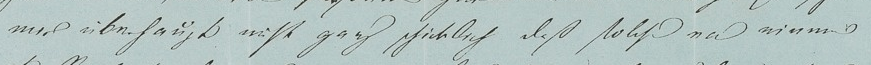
mir überhaupt nicht ganz schicklich daß solche von einem
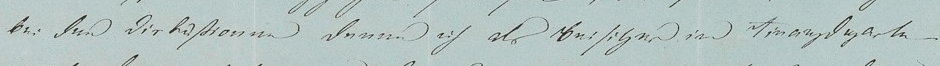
bei den Diskußionen denen ich als Beisitzer im Finanzdeparte-
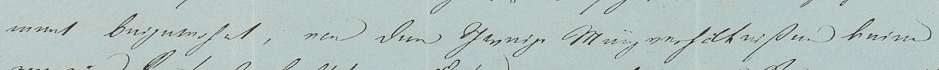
ment beigewohnt, von den Schweiz. Münzverhältnißen keine
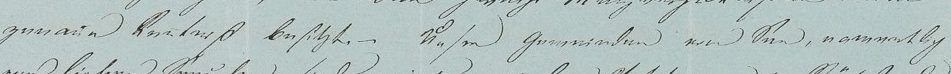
genaue Kenntniß besitzt. Unsre Gemeinden vom See, namentlich
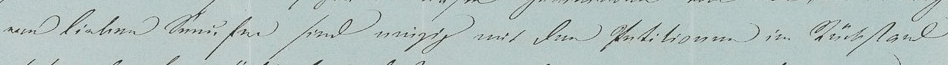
vom linken Seeufer sind einzig mit den Petitionen im Rückstand
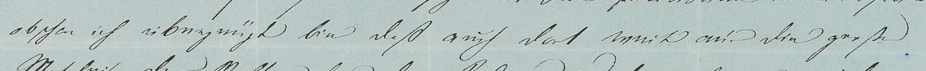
obschon ich überzeügt bin daß auch dort weit aus die große
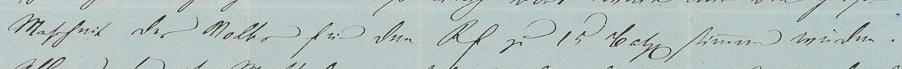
Mehrheit des Volks für den Rf zu 15 Batzen stimmen würden.
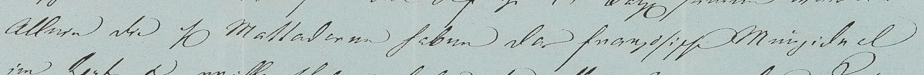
Allein die H Mattadoren haben das französische Münzideal
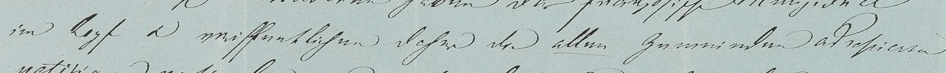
im Kopf & veröffentlichen daher die allen Gemeinden adressierten
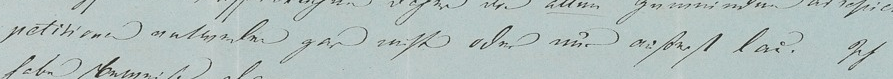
petitionen entweder gar nicht oder nur außerst lau. Ich
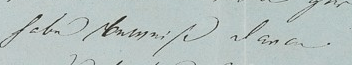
habe Beweise davon.
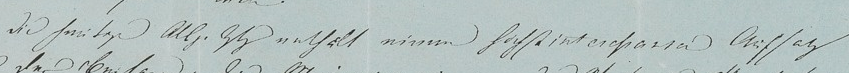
Die heutige Allg. Ztg enthält einen hochinteressanten Aufsatz
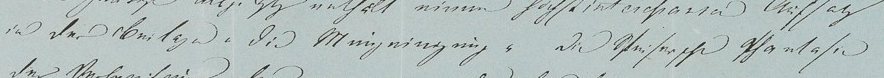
in der Beilage «Die Münzeinigung» Die Speisersche Phantasie
